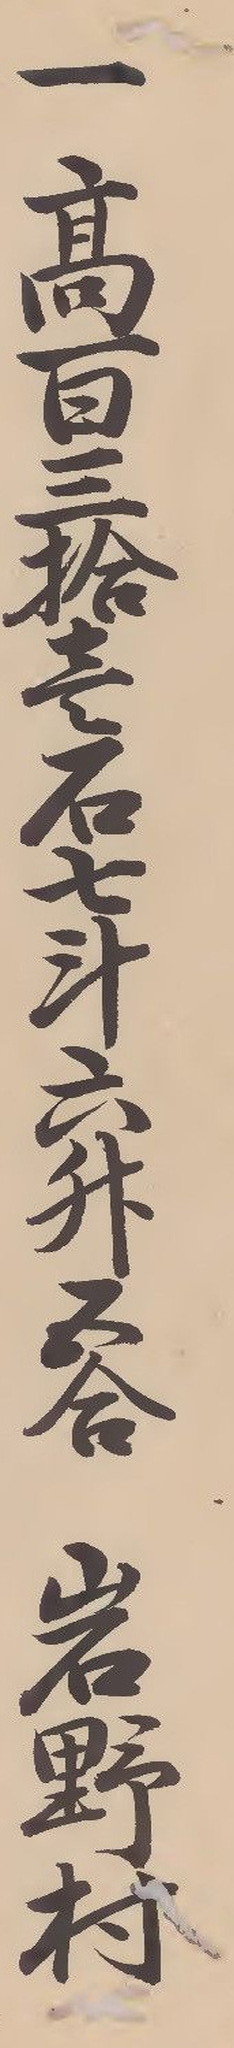一高百三拾壱石七斗六升五合岩野村
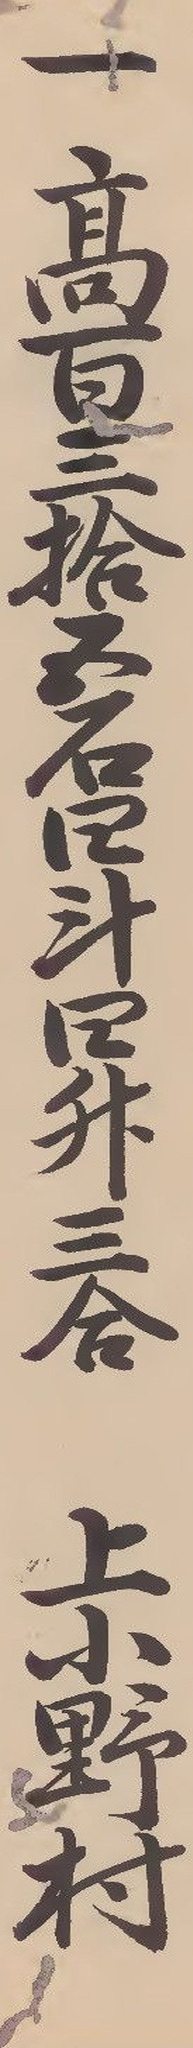一高百三拾五石四斗四升三合上小野村
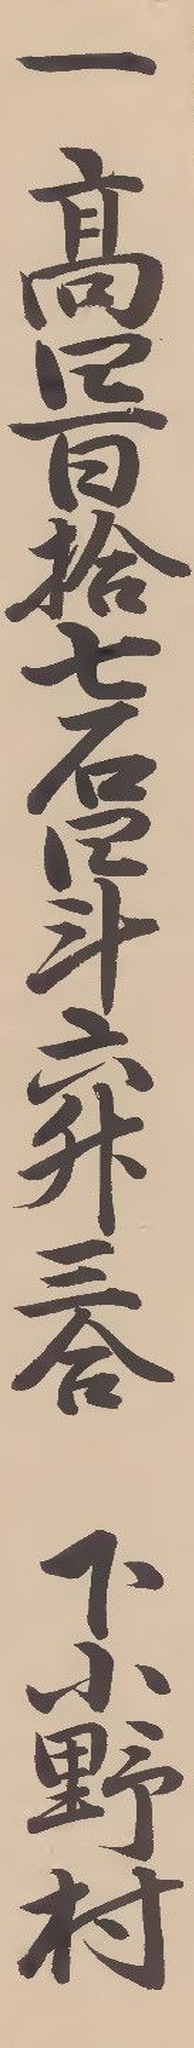一高四百拾七石四斗六升三合下小野村

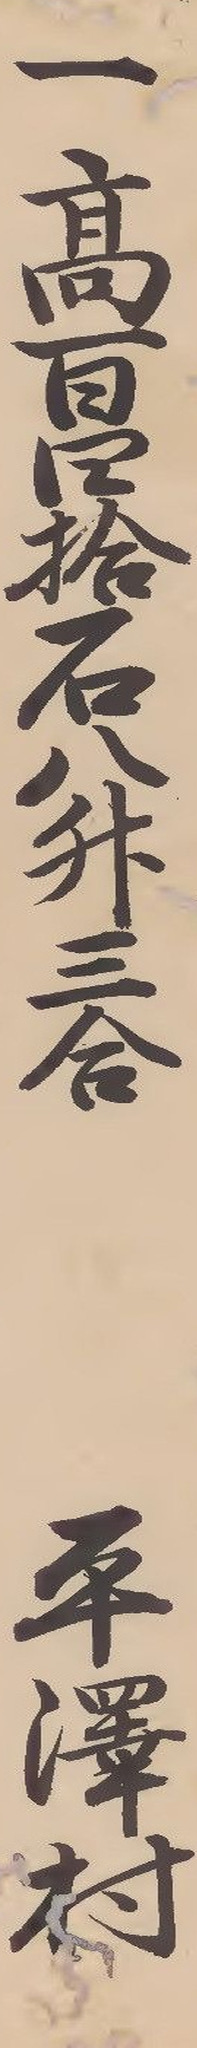一高百四拾石八升三合平沢村
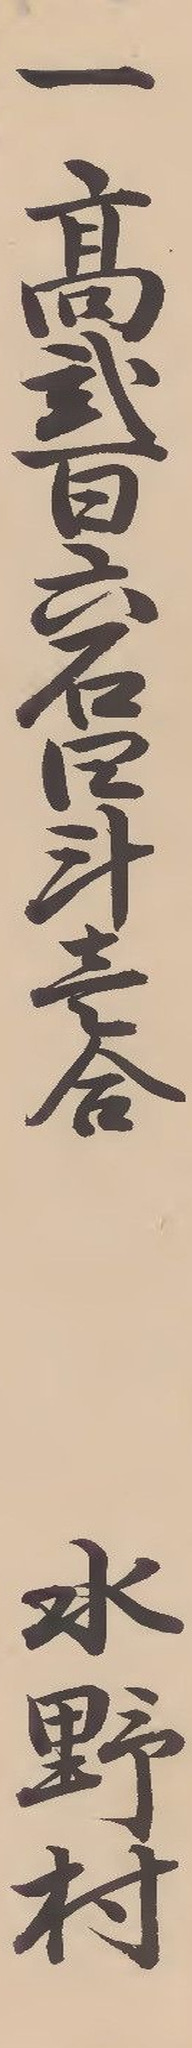一高弐百六石四斗壱合水野村
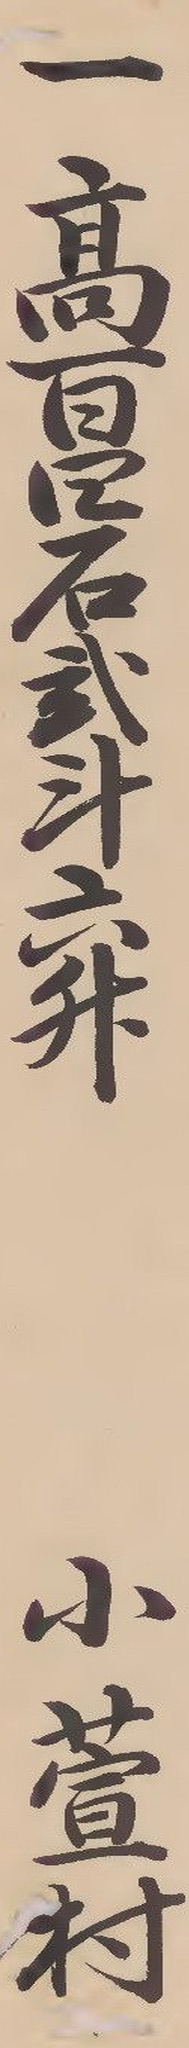一高百四石弐斗六升小萱村
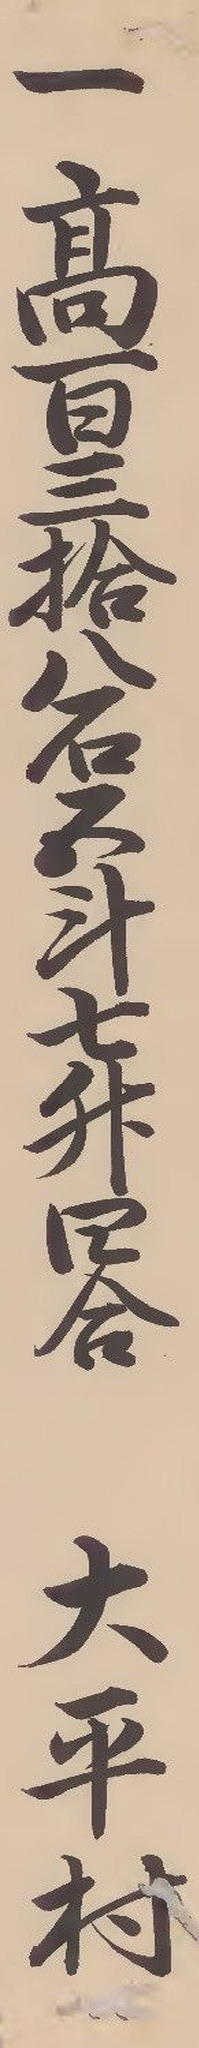一高百三拾八石五斗七升四合大平村
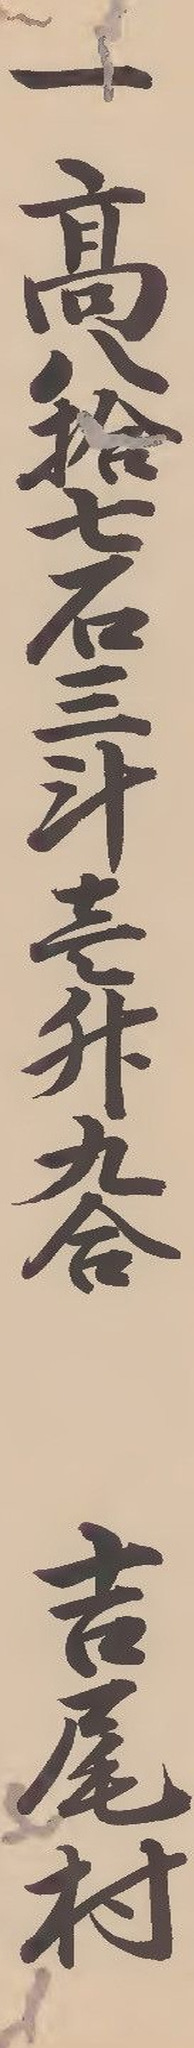一高八拾七石三斗壱升九合吉尾村
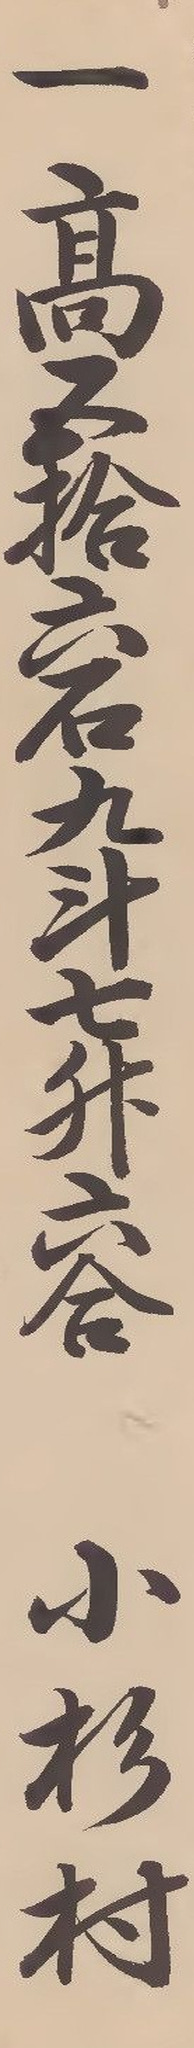一高五拾六石九斗七升六合小杉村
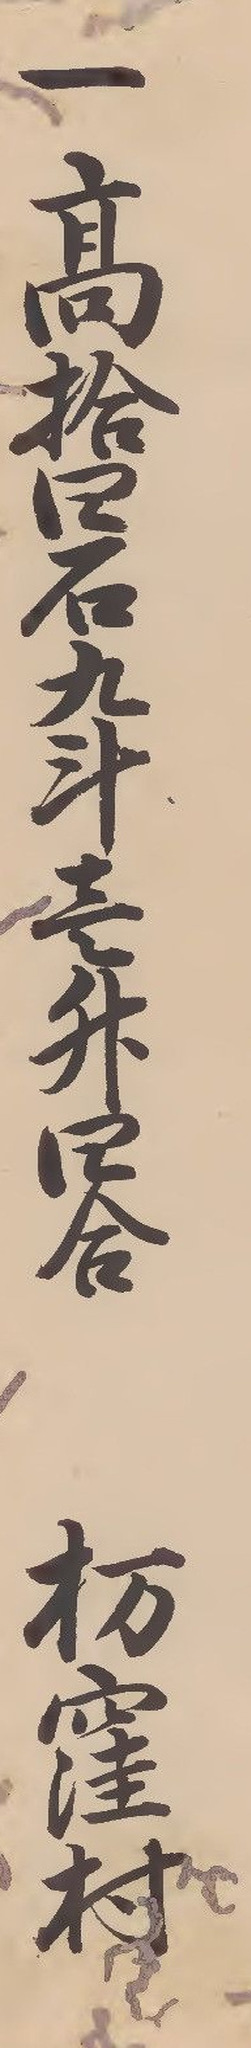一高拾四石九斗壱升四合栃窪村

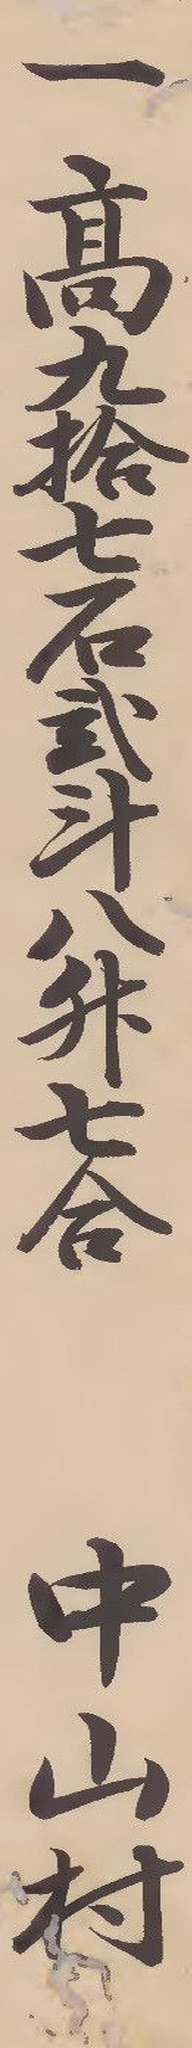一高九拾七石弐斗八升七合中山村
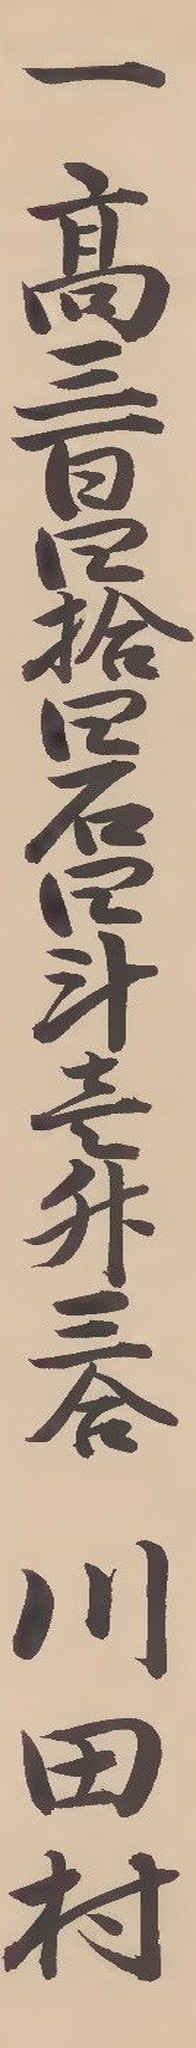一高三百四拾四石四斗壱升三合川田村
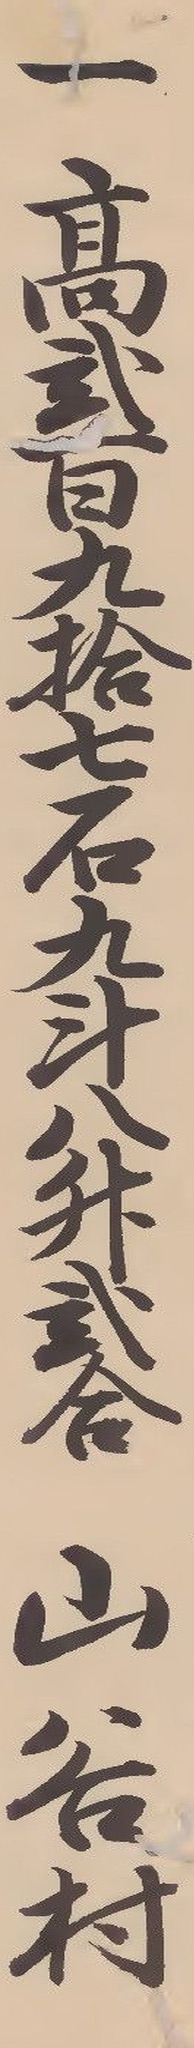一高弐百九拾七石九斗八升弐合山谷村
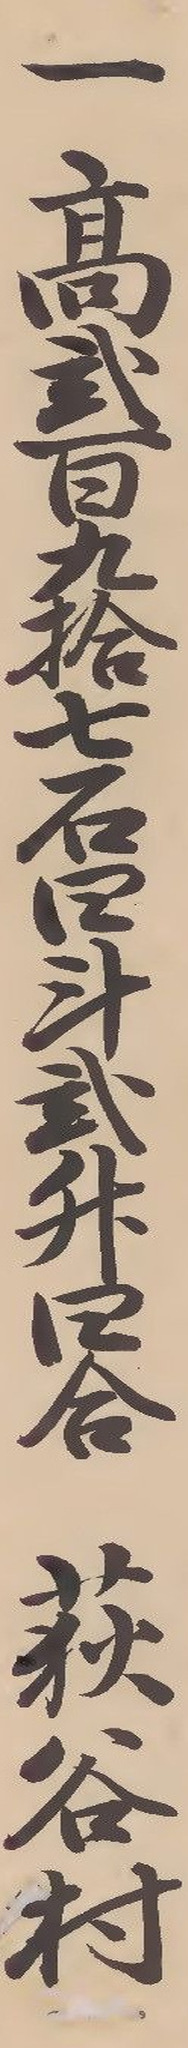一高弐百九拾七石四斗弐升四合荻谷村
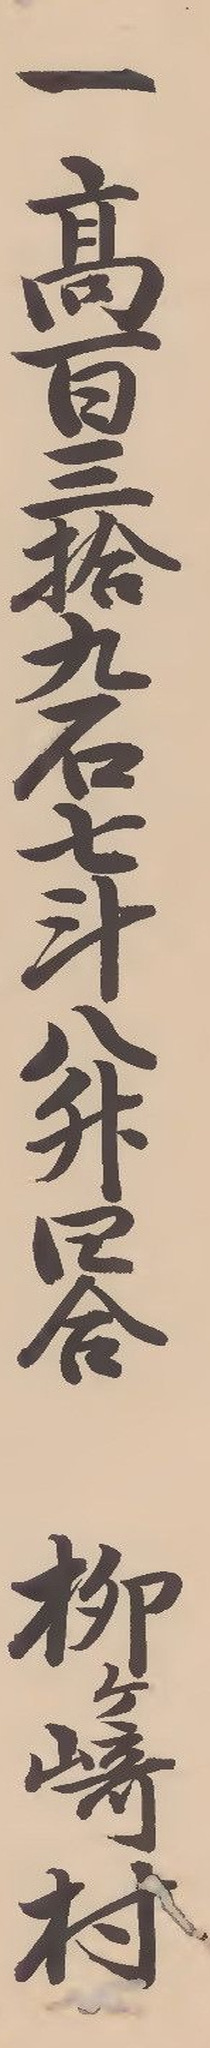一高百三拾九石七斗八升四合柳ヶ崎村
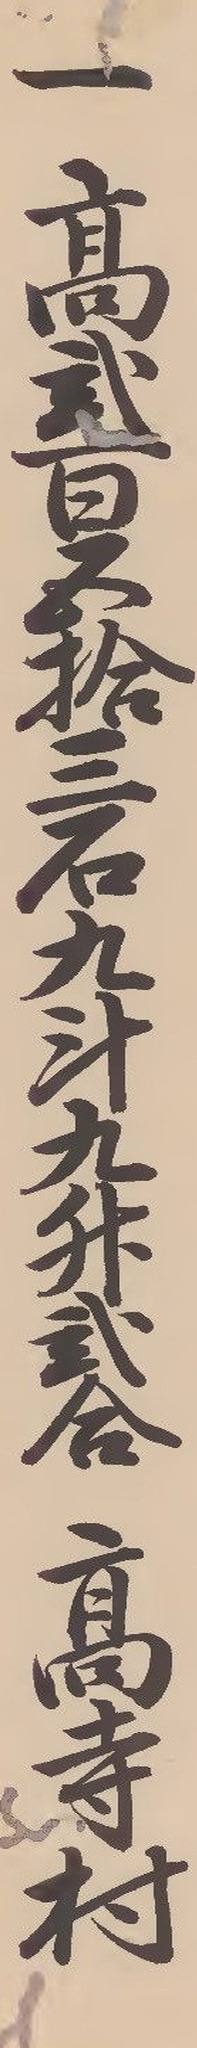一高弐百五拾三石九斗九升弐合高寺村
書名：越後国郷帳　上
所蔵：国立公文書館 National Archives of Japan
